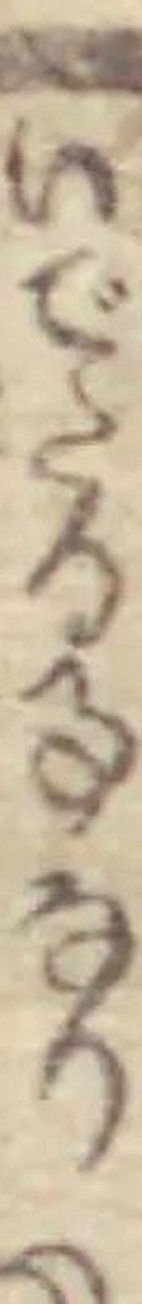いでたる事なり
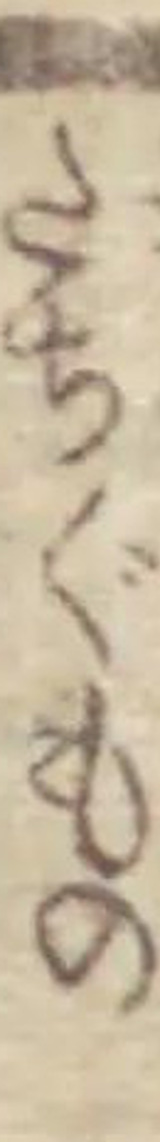たちぐもの
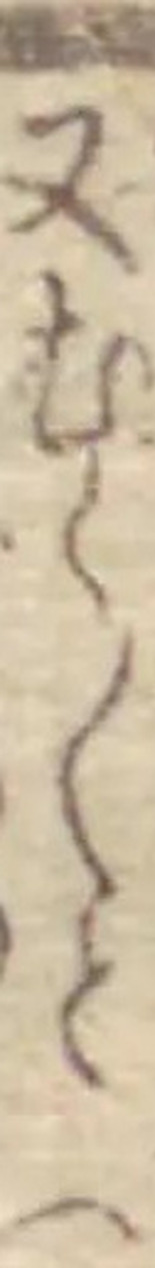又むく〳〵と
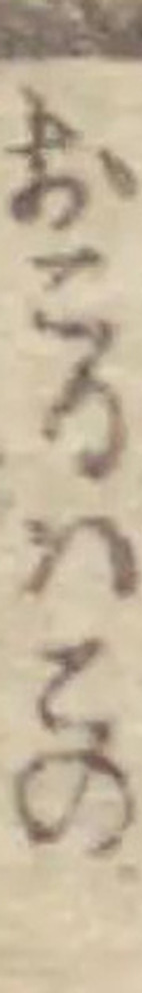おこるはこの
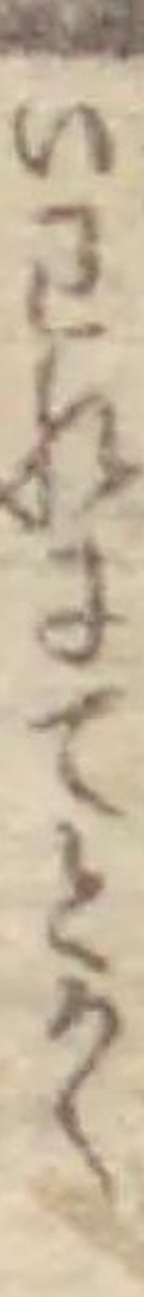いわれにてとかく
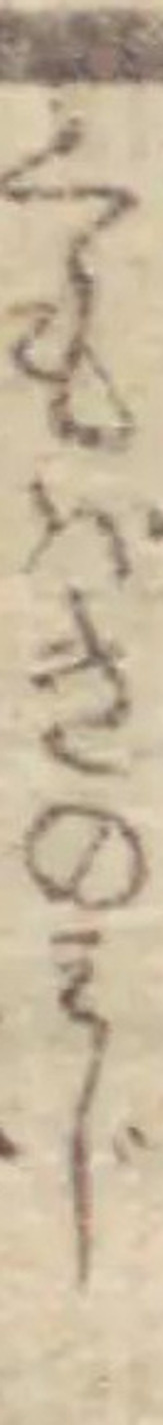くもはきのみじ
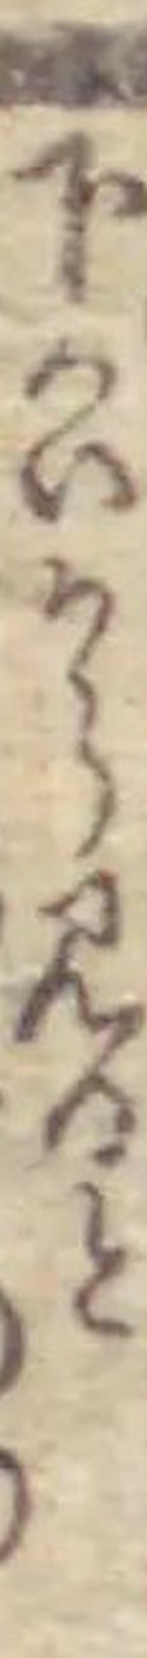下かいから見ると
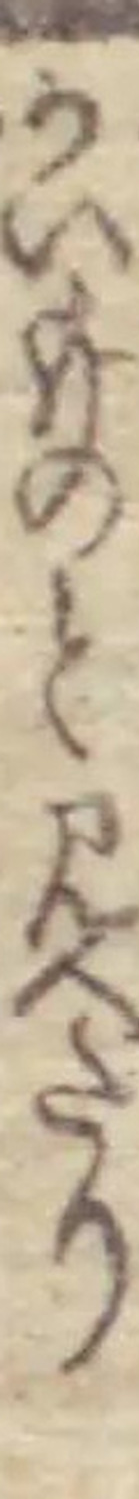かいものと見へたり
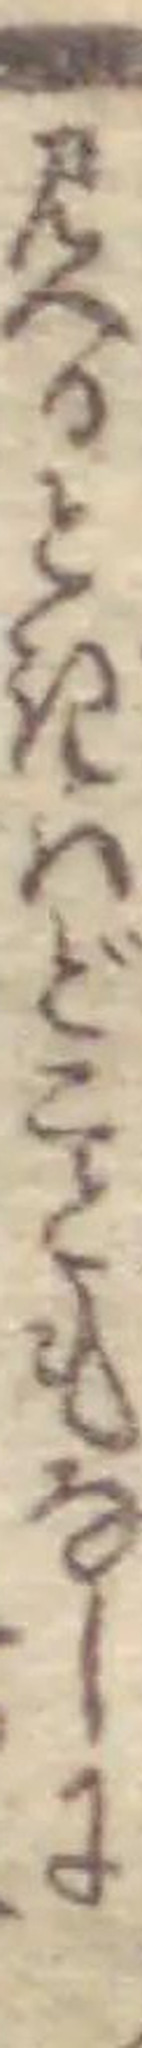見へるときはどこともなしに
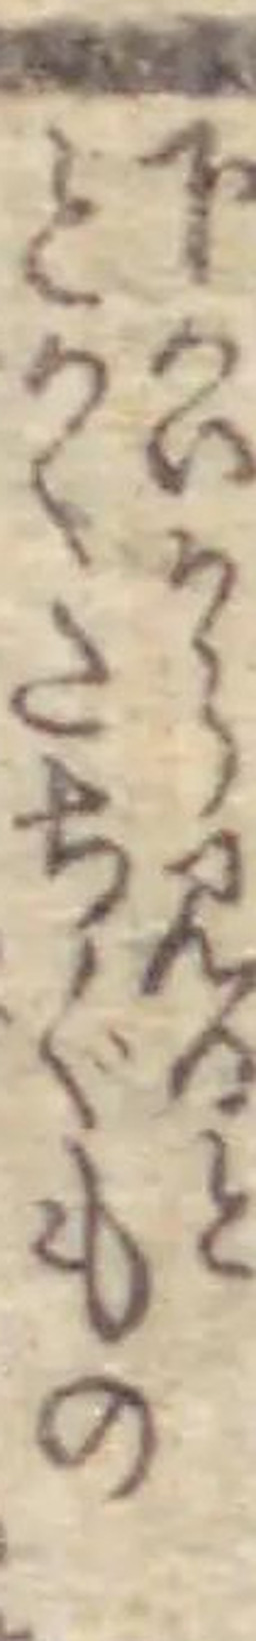とかくたちぐもの
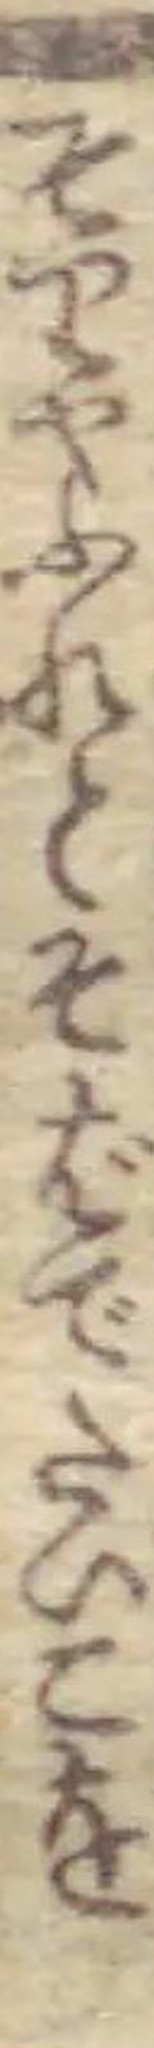そりやふれとそばでたいこを
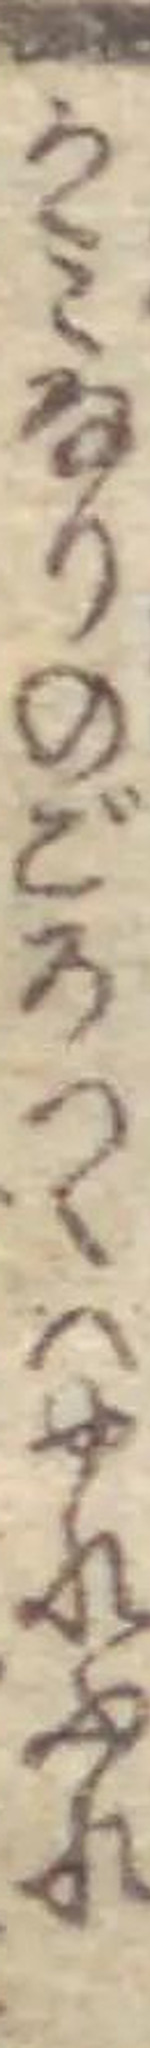かみなりのごろつくはやれふれ
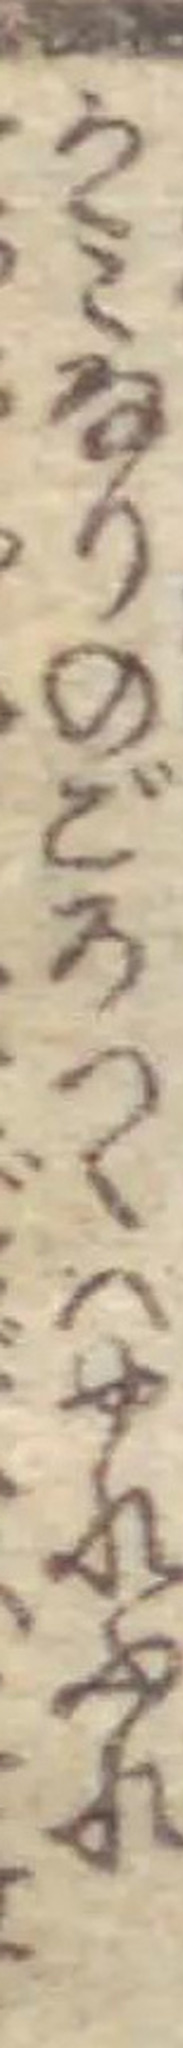かみなりのごろつくはやれふれ
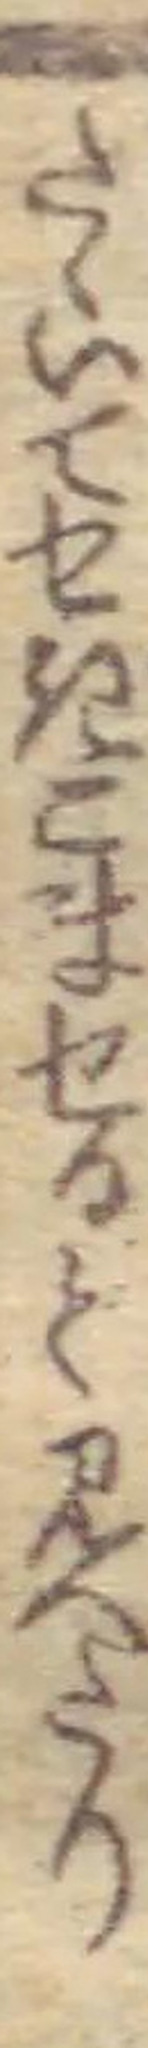たゝいてせきこませると見へたり

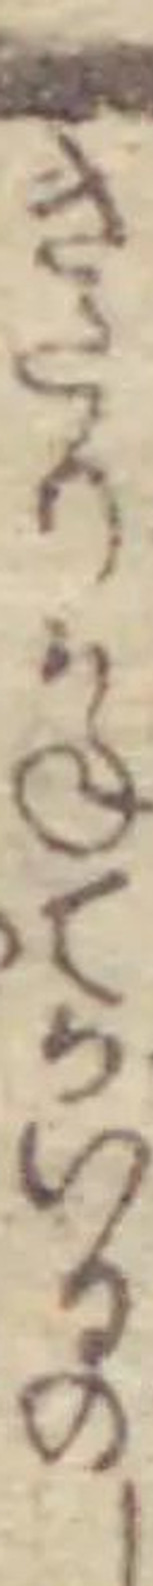きたりかねてかいるの
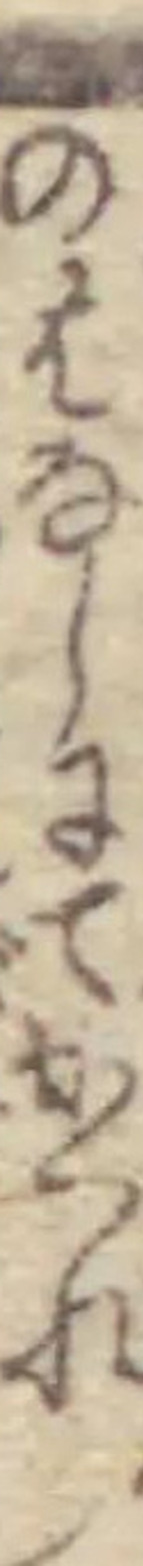のはなしにてかくれ
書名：雨宮風宮出儘略縁記 3巻
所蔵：国立国会図書館 National Diet Library, JAPAN
